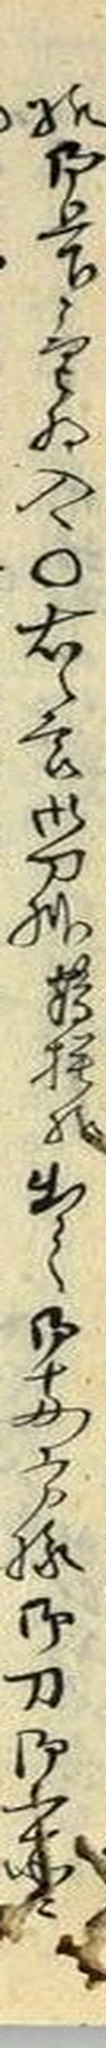様御上下ニ而被為入候〇右之節御刀掛鶴模様出之御両方様御刀御一所ニ
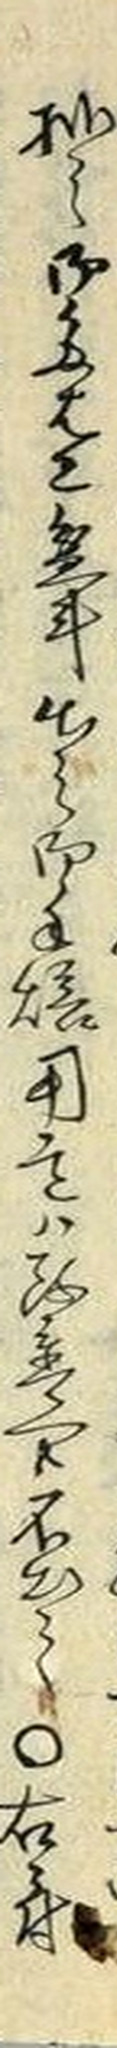掛之御たはこ盆斗出之御手焙用意ハ致置候へ共不出之〇右ニ付
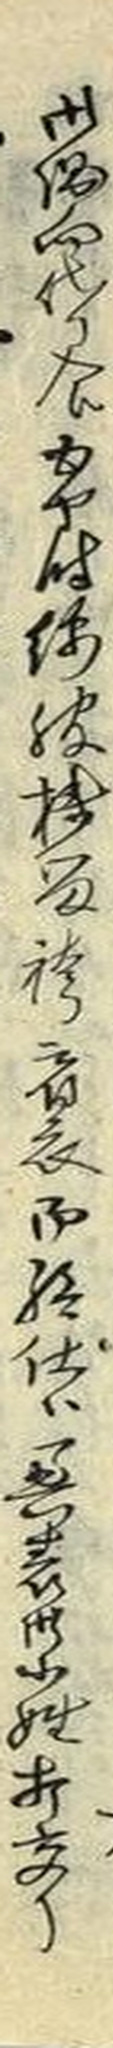御側向代り合五半時綿服桟袴肩衣御給仕ハ奥表御小姓打交り
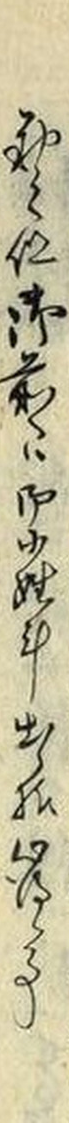勤之但御前へハ御小姓斗出候様心得候事
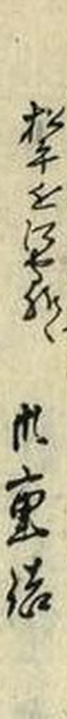松平近江守様へ御重詰
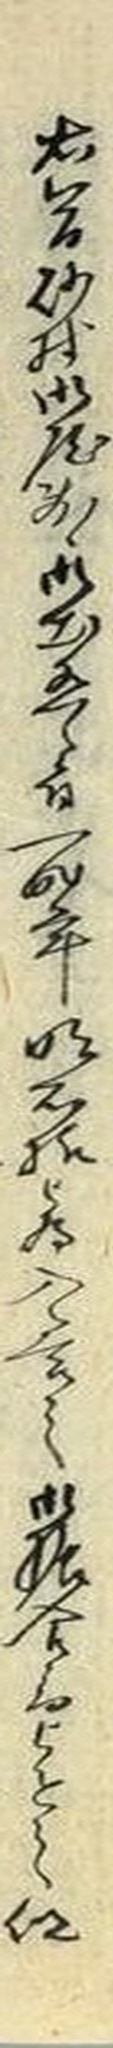右今日砂村御屋敷へ御出有候ニ付一昨年明石様被為入候節之御振合ニ而被進之但
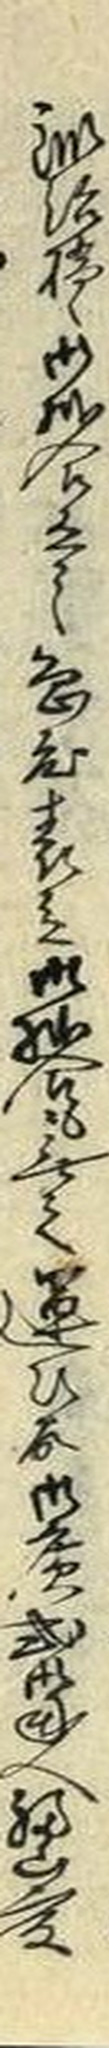鍛冶橋之御掛合有之急度表立而御掛合も無之運ひ故御広式御用人福山藤
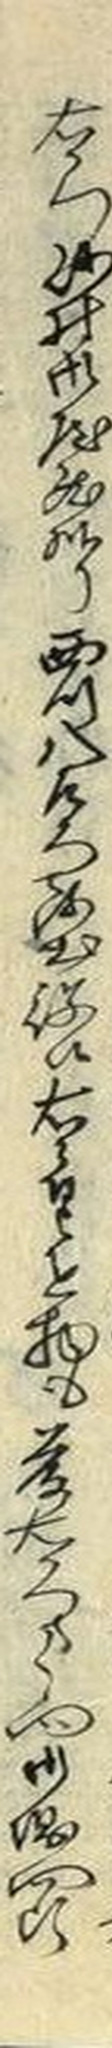右衛門砂村御屋敷掛り西川八左衛門致出役候右ニ付進物も藤右衛門方へ向御側向頭
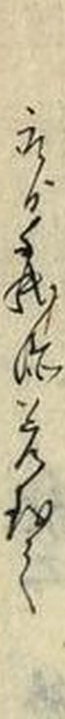取ゟ手紙添差越之
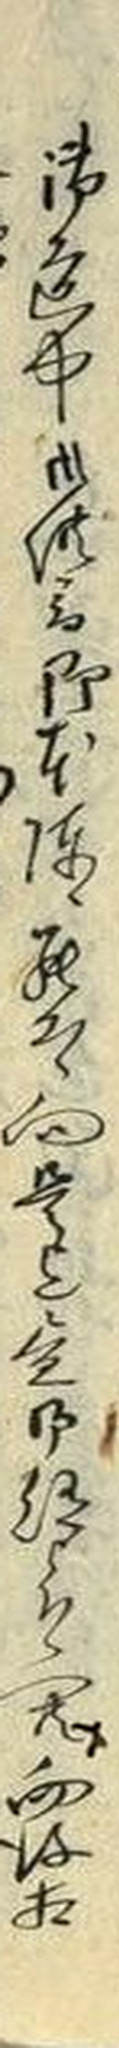御道中御供ニ而御本陣へ罷出候向是迄昼御賄被下候へ共向後相
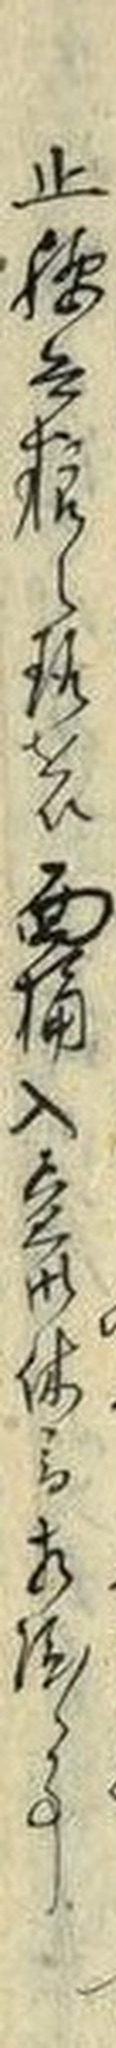止腰兵粮之趣を以面桶入昼御休ニ而相渡候事
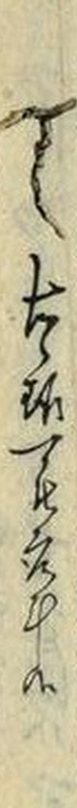右之趣可被取斗候
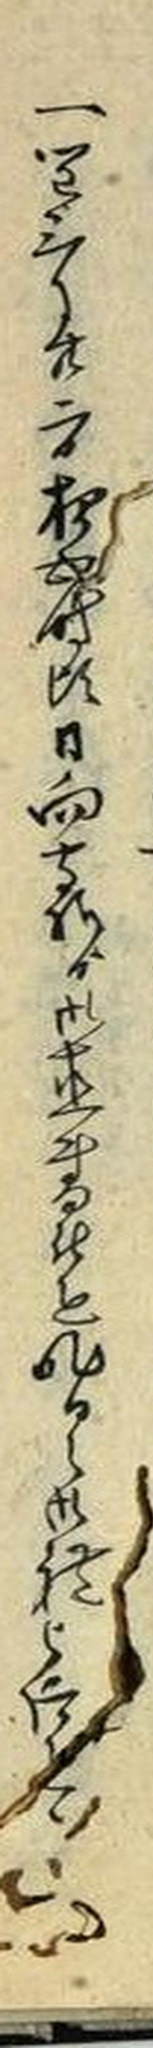一閏三月廿二日夜五時頃日向守様ゟ御直書被進昨日之御礼被仰上候

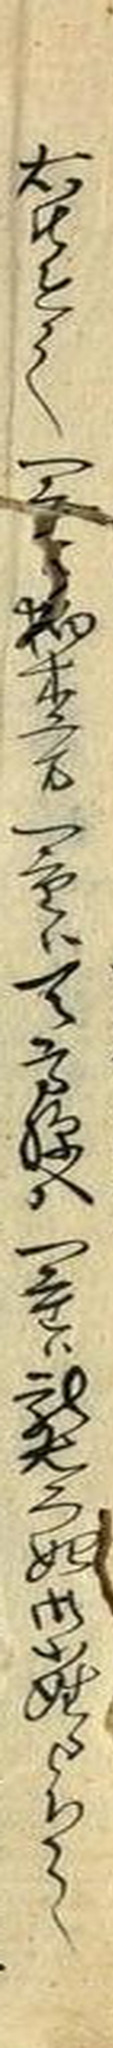右被進之一重ハ狛木工方一重ハ天方孫八一重ハ新右衛門始御小姓へ被下之
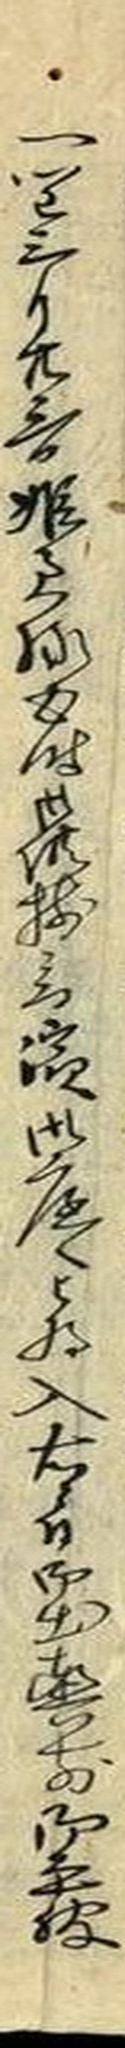一閏三月廿三日姫君様五時御供揃ニ而濱御庭へ被為入右ニ付御出輿前御平服
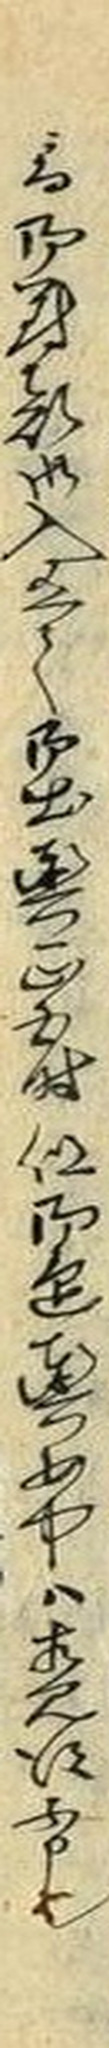ニ而御対顔御入有之御出輿正五時但御迎輿女中ハ相見得不申由
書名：少傅日録抄（斉承付側向頭取日記、在府）
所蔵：福井県文書館 Fukui Prefectural Archives
